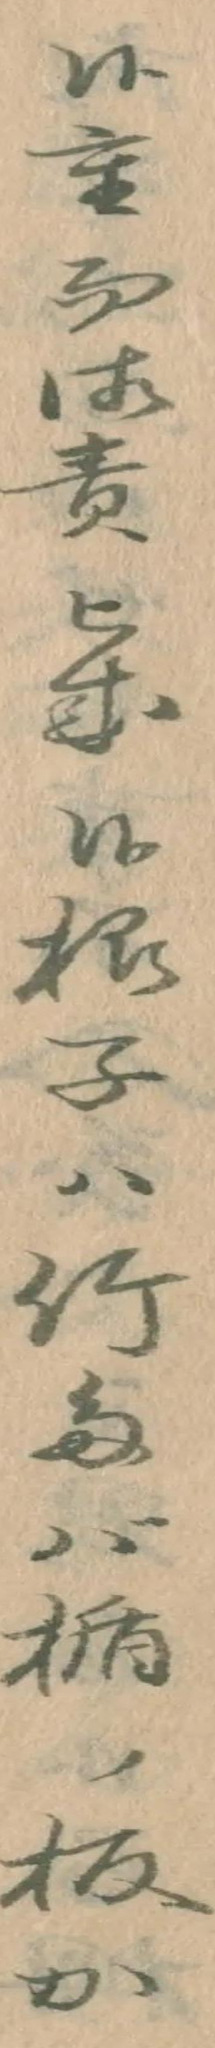候重而御責被成候様子は竹多ば楯之板か
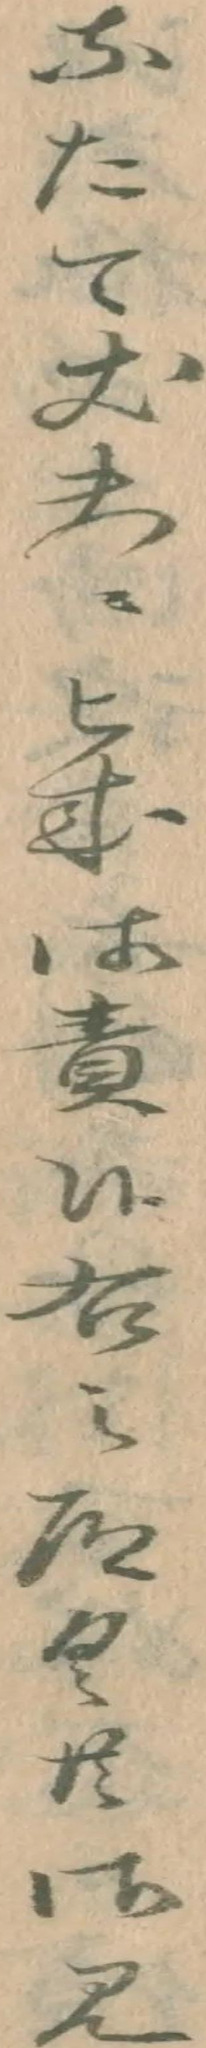なたて丈夫に被成御責候右之道具共御見
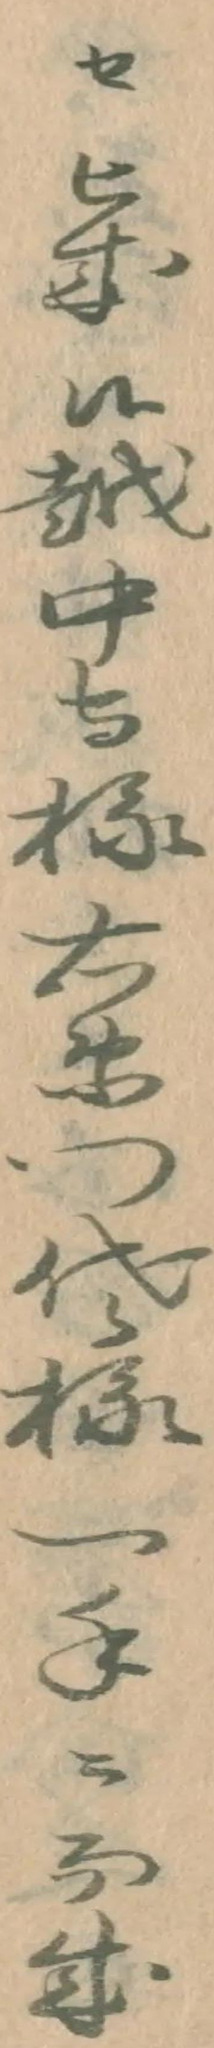せ被成候越中守様右衛門佐様一手に而成

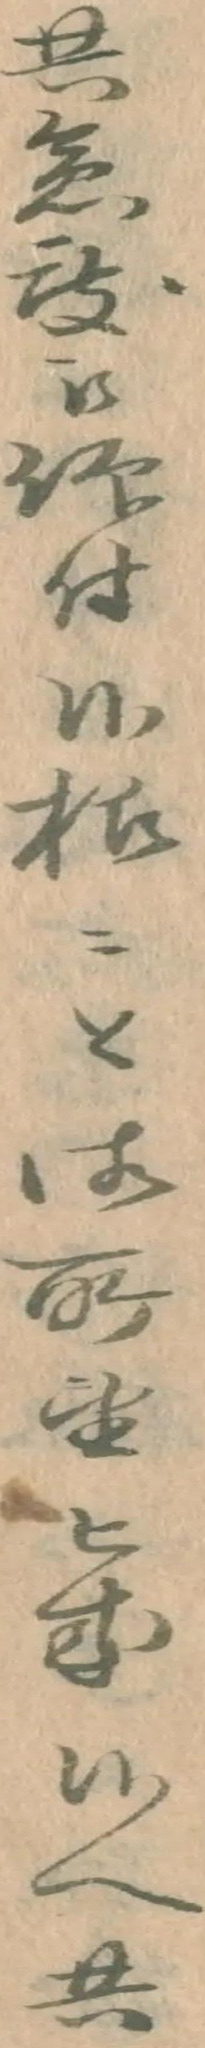共急度被仰付候様にと御所望被成候へ共
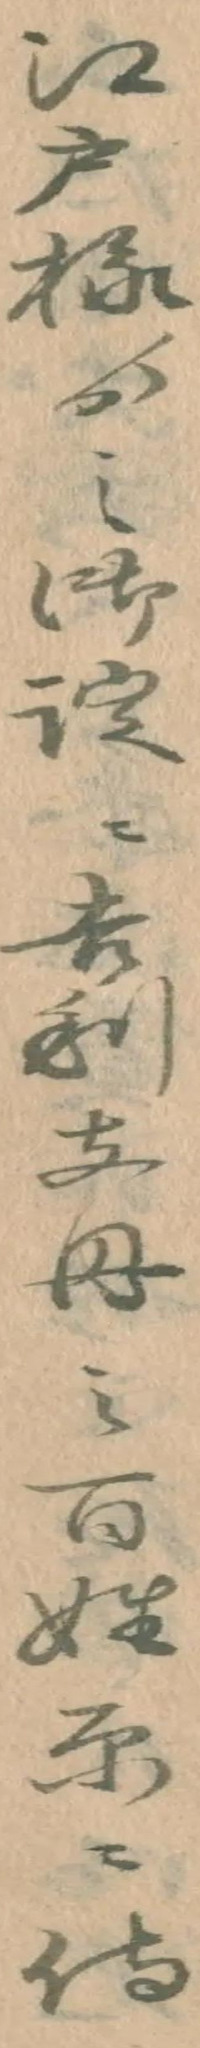江戸様ゟ之御諚に吉利支丹之百姓原に侍
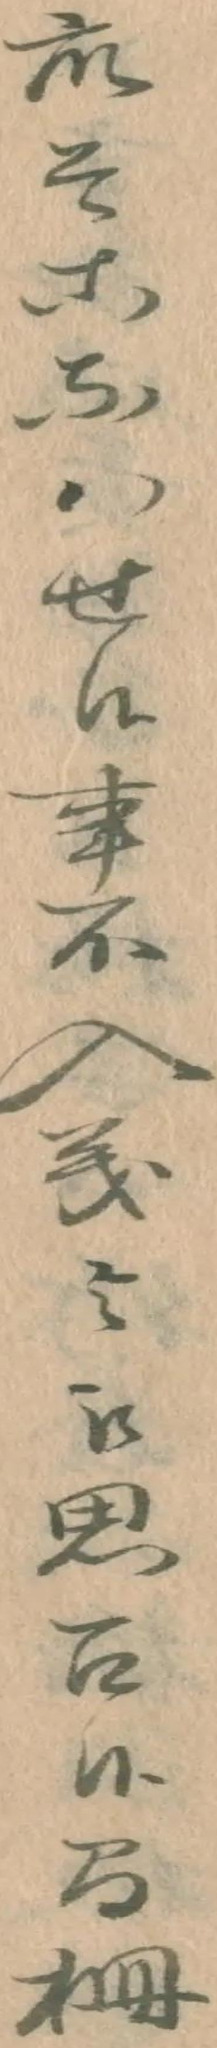衆そ古なはせ候事不入義与被思召候間柵
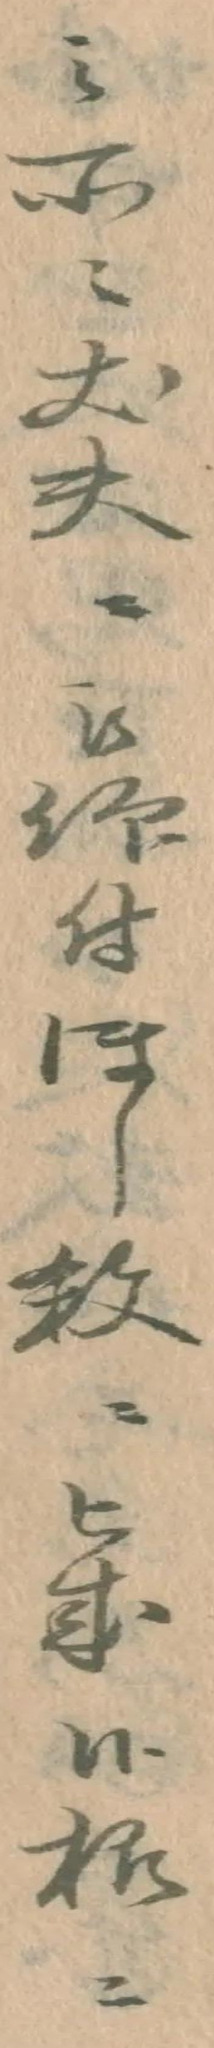之所に丈夫に被仰付ほし数に被成候様に
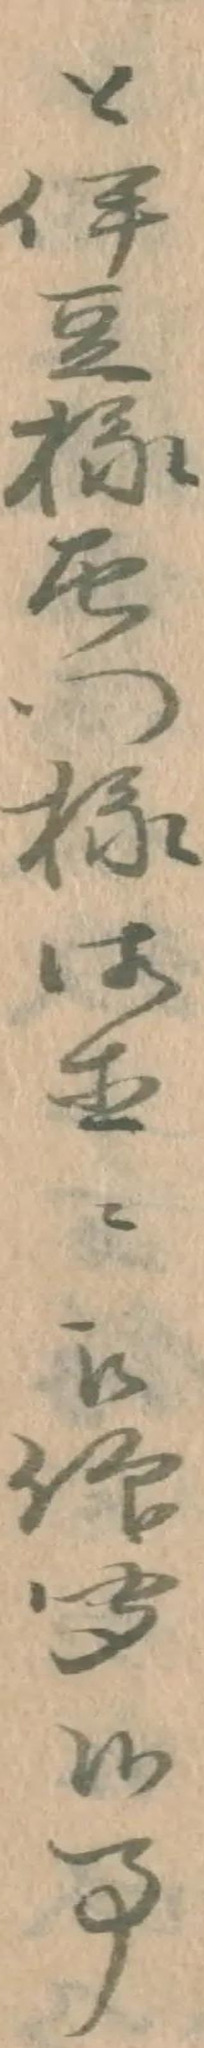と伊豆様左門様御直に被仰聞候事
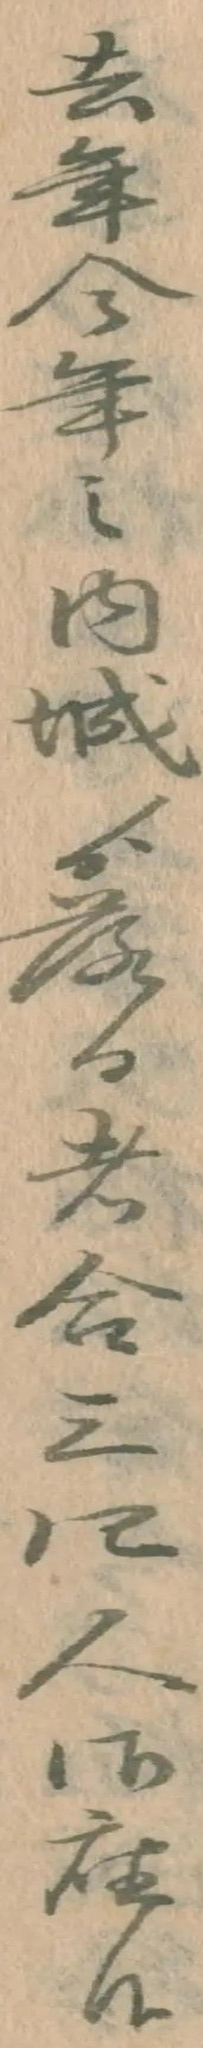一去年今年之内城ゟ落る者合三四人御座候
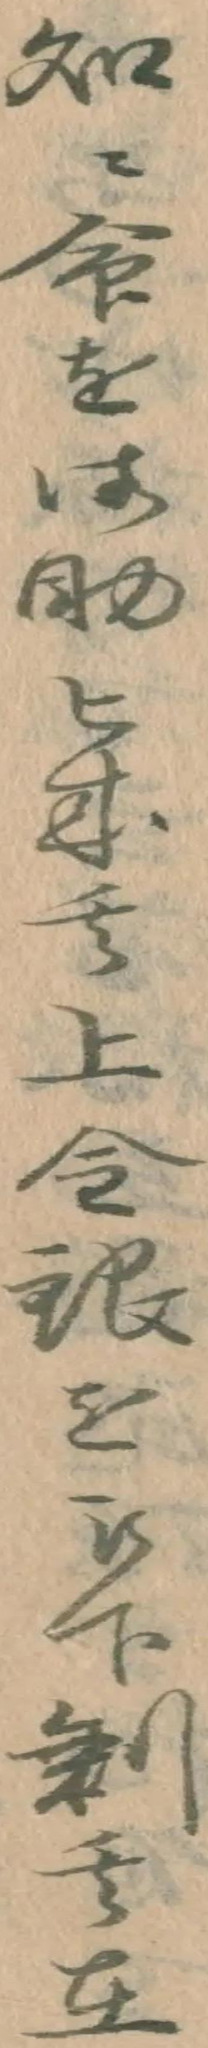処に命を御助被成其上金銀を被下剰其在
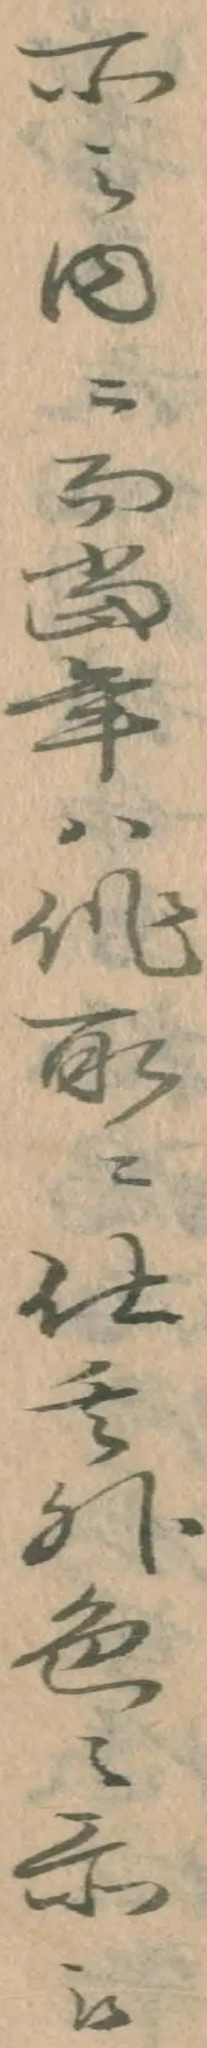所之内に而当年は作取に仕其外色々忝被
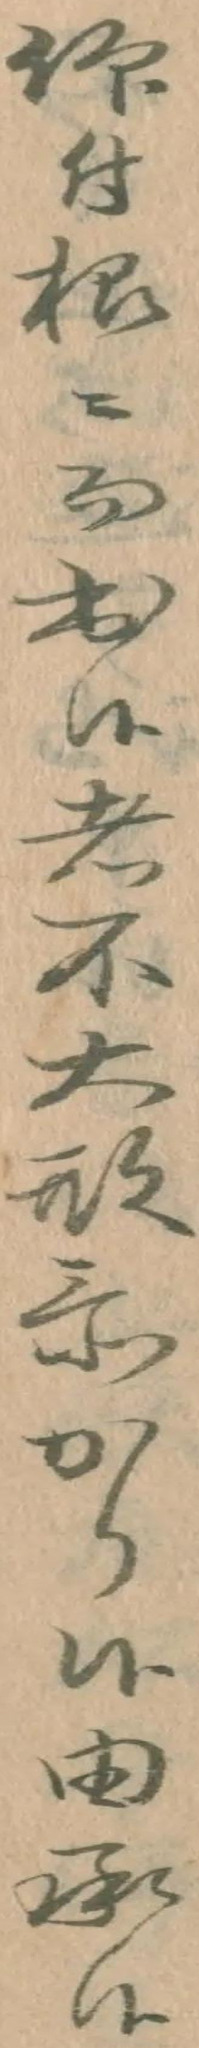仰付様に而出候者不大形忝かり候由承候
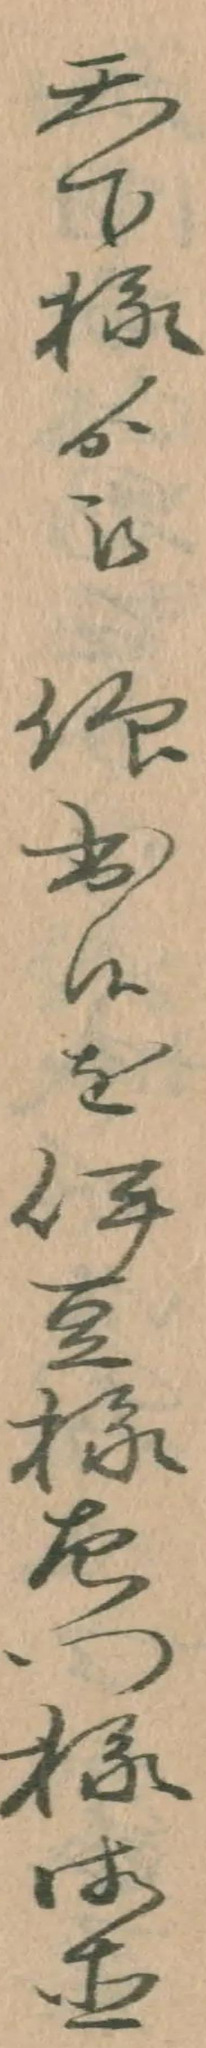一天下様ゟ被仰出候を伊豆様左門様御直
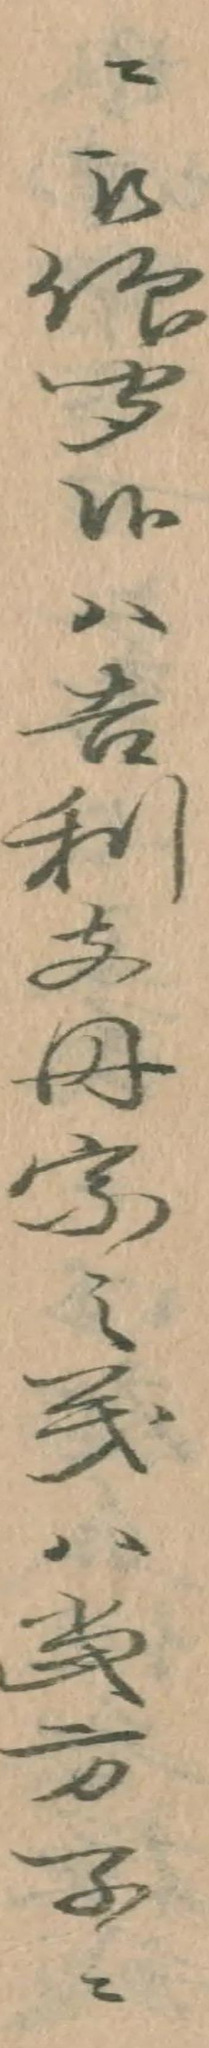に被仰聞候は吉利支丹宗之義は当方子に
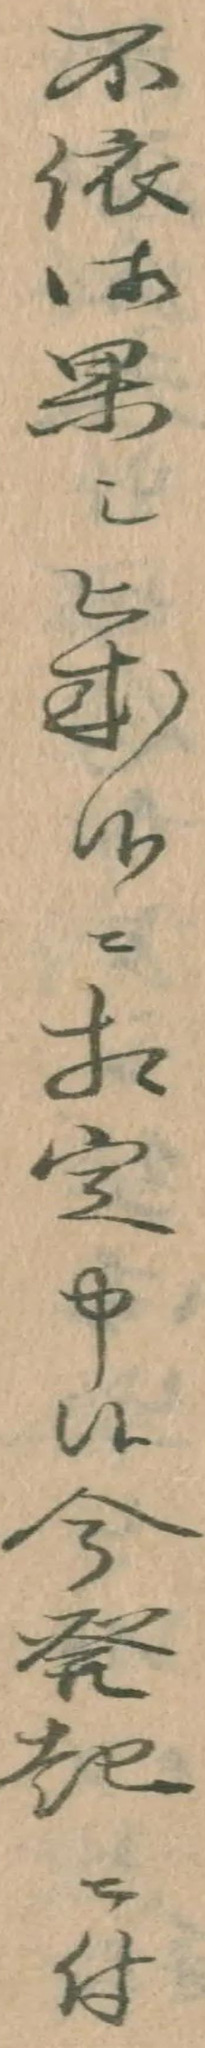不依御果し被成候に相定申候今発起に付
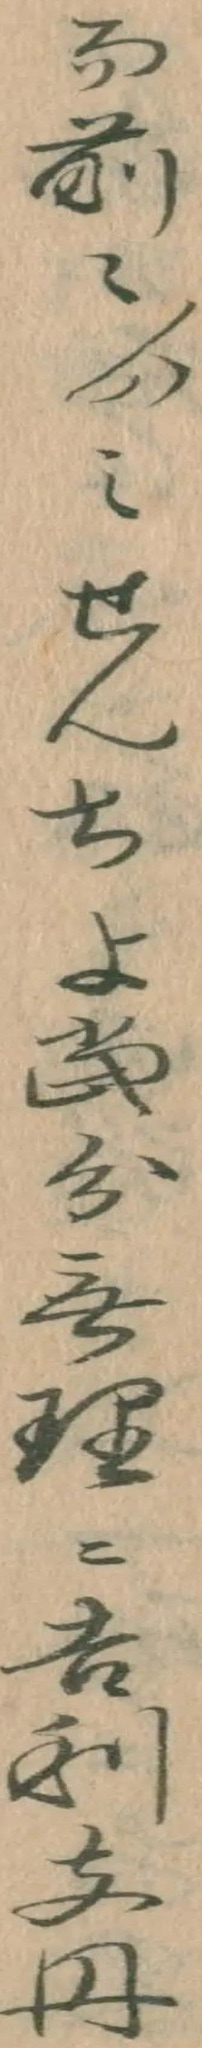而前々ゟ之せんちよ当分無理に吉利支丹
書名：切支丹御退治記 49巻. [6]
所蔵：国立国会図書館 National Diet Library, JAPAN
